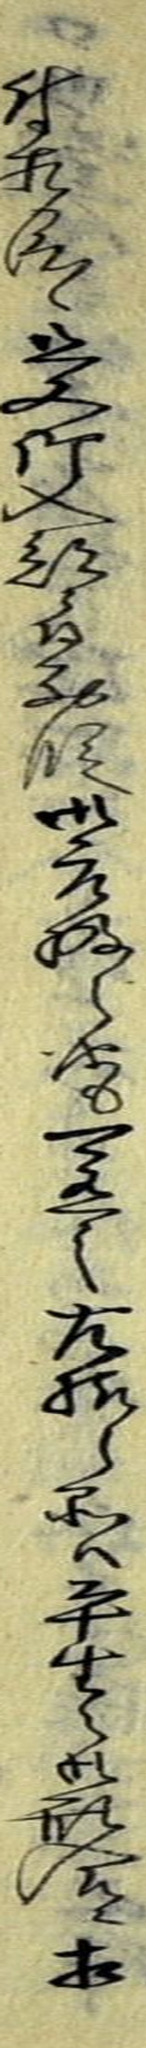付相渡候且又御入部に付別段御取扱之儀も可有之左様之品は平生之御形合に相
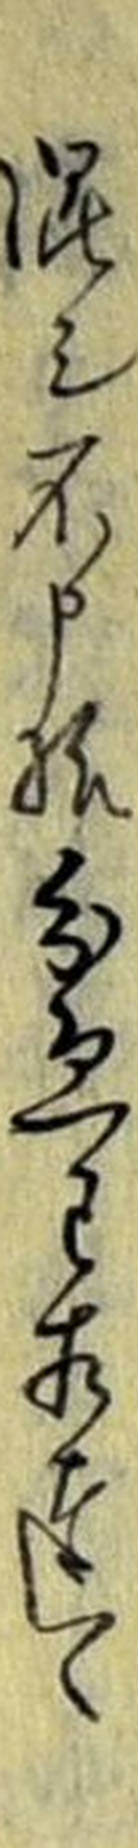混し不申様分而可被相達候

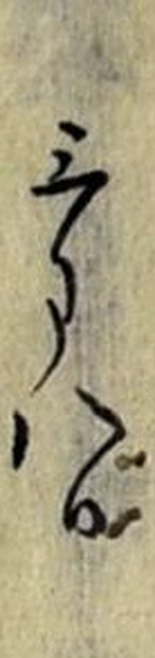三月八日
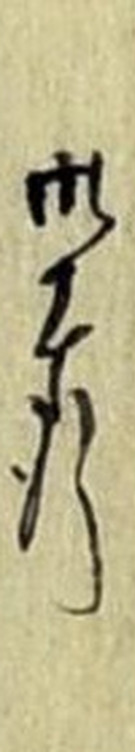御奉行
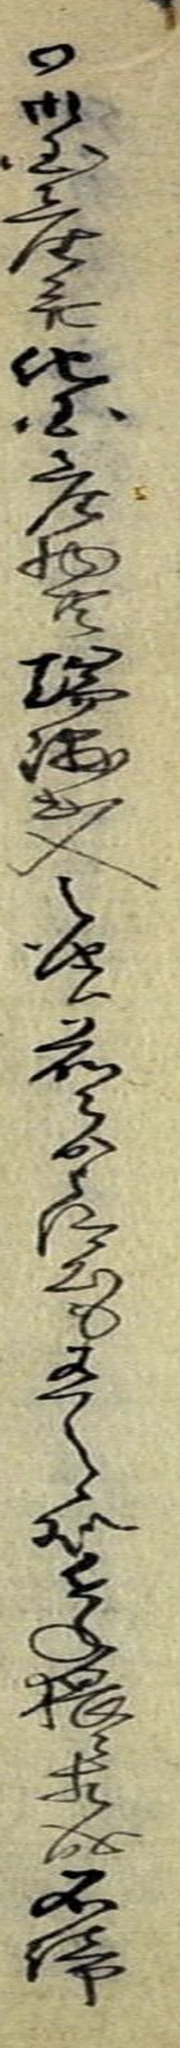○御国産并他国産物共端浦出入之儀は前々ゟ被仰出も有之候処近年猥に相成不締
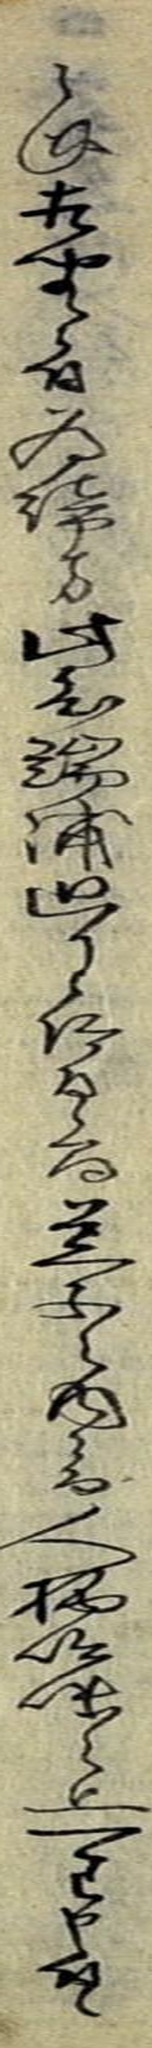之趣相聞候に付為締方此度端浦廻り被仰付候間荒子之内に而人柄吟味之上可被申付候
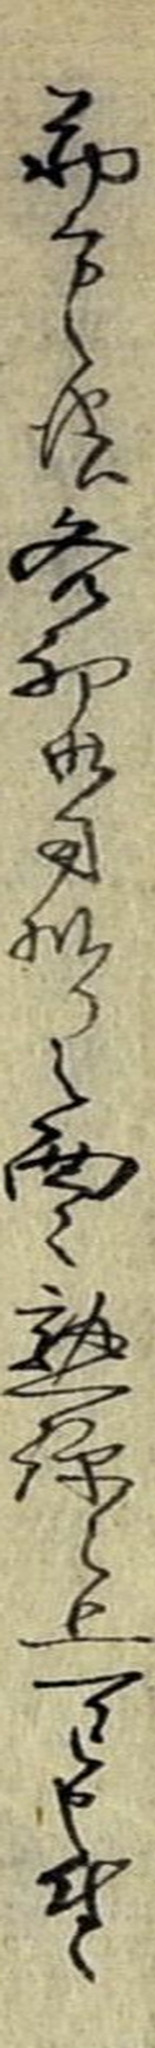勤方之儀は各初御用掛り之面々熟評之上可被申付候
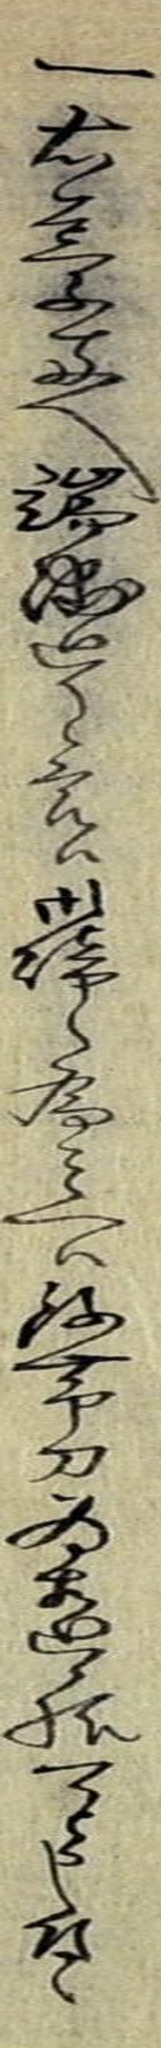一右荒子両人端浦廻り之節は御締之為に候へは致帯刀為相廻候様可被申付候
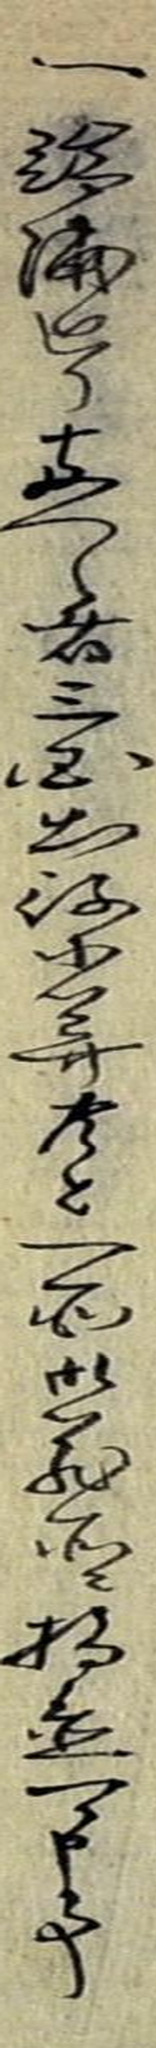一端浦廻り両人之者三国出役小算共と一所御蔵所に指置可被申事
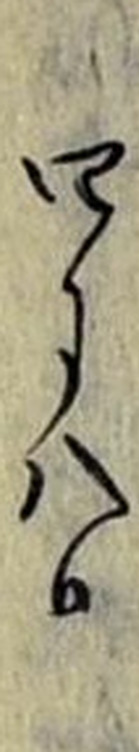四月八日
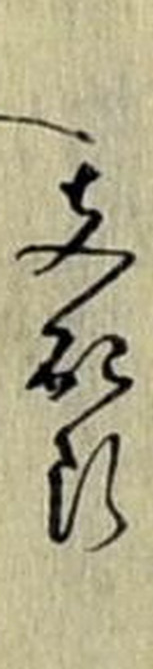支配頭
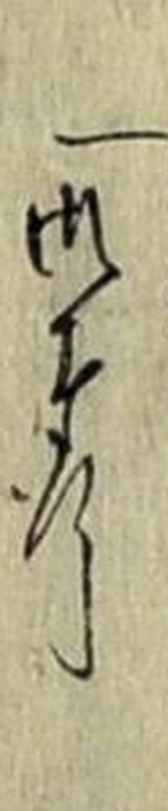御奉行
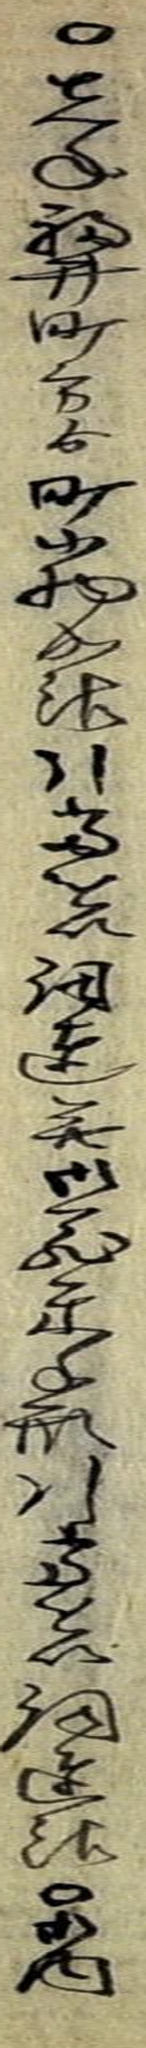○先年福井町方ゟ町小物成銀引当を以調達并御蔵米手形引当を以調達銀○御内
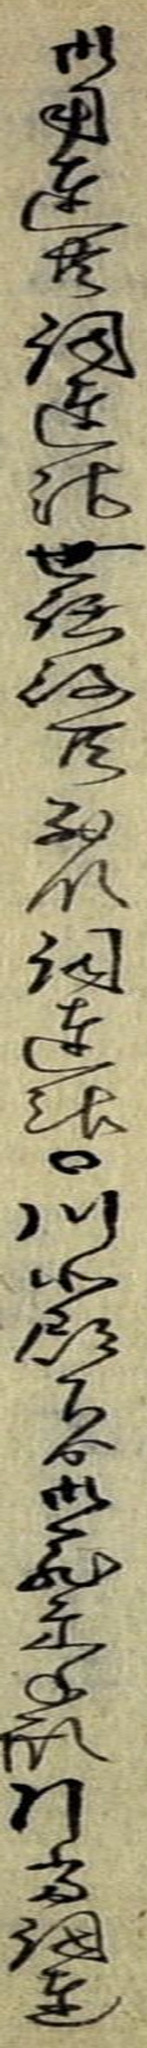御用達并調達銀世話役共別段調達銀○川北郡下ゟ御蔵米手形引当調達
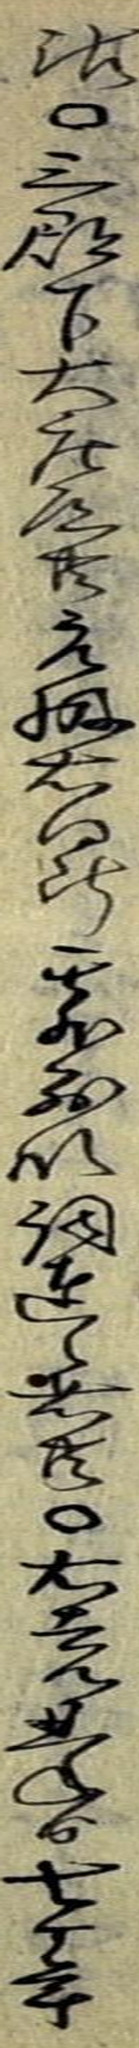銀○三郡下大庄屋共取扱右同断其外別段調達之者共○右去る丑年ゟ七ヶ年
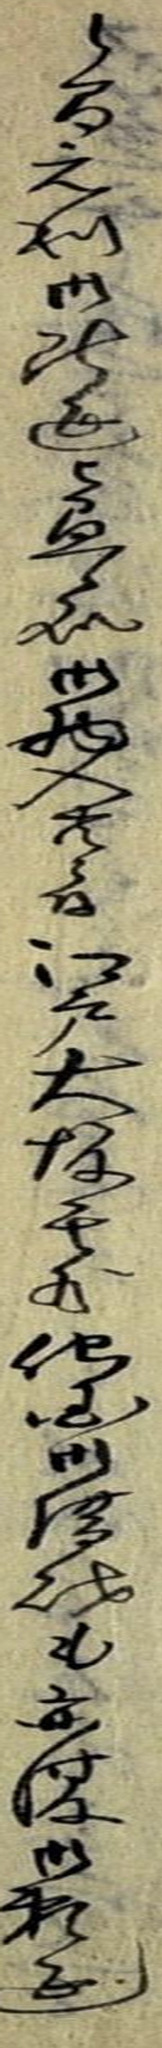之間元利御断通被置候処御物入共に付江戸大坂其外他国御借財も亦復御頼延
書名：命令之部 四
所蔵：福井県文書館 Fukui Prefectural Archives
